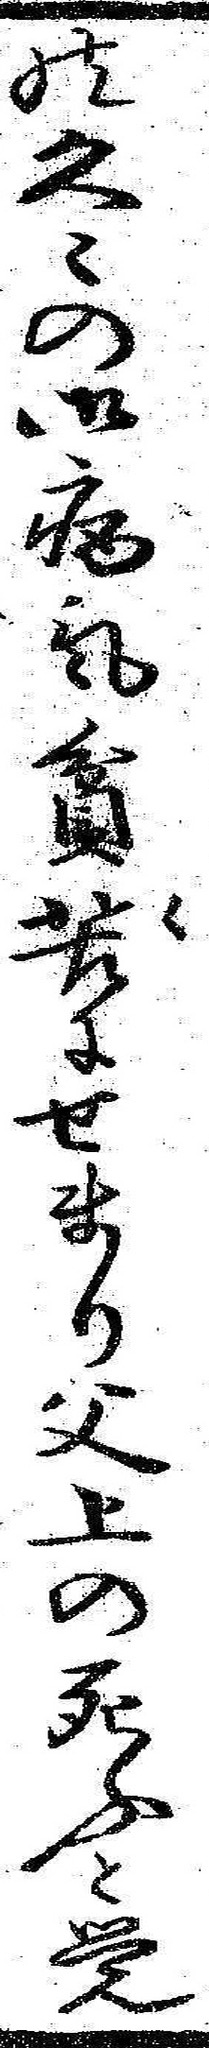の久々の御病気貧苦にせまり父上の死ふと覚
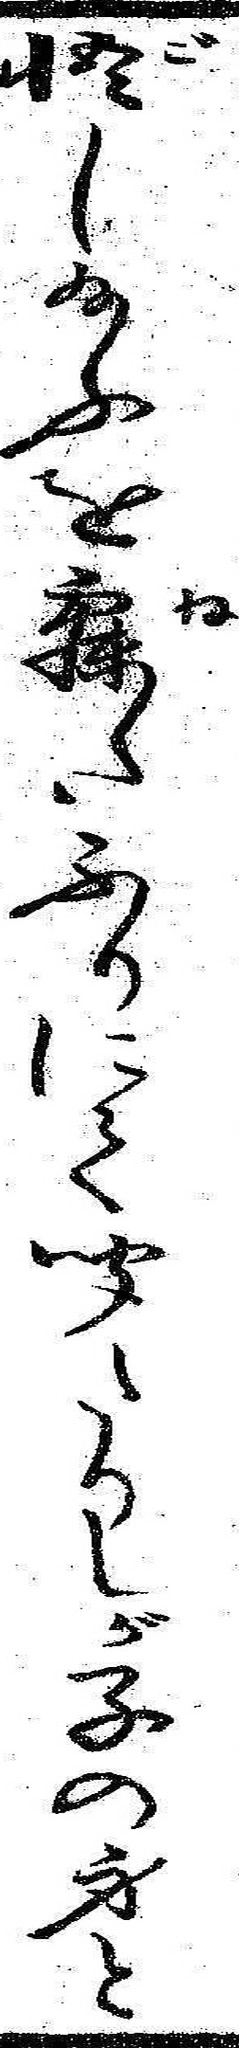悟し給ふを寝たふりにて聞たりしが子の身と
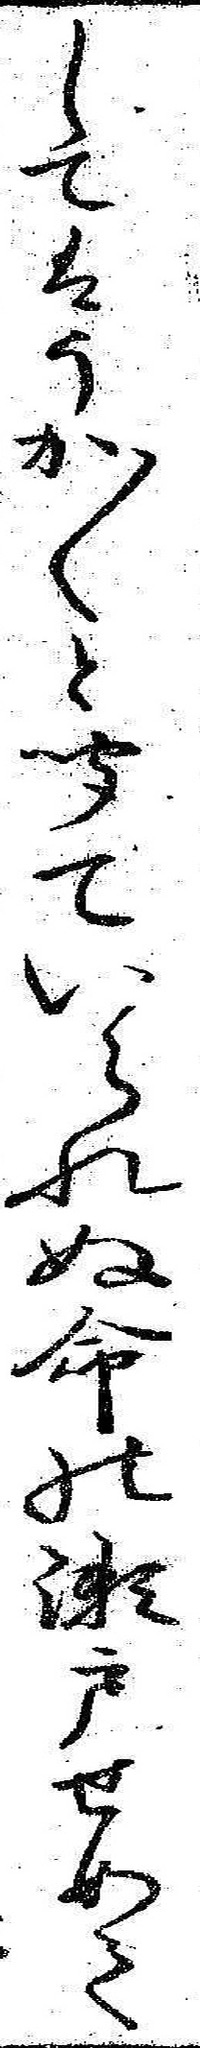してはうか〱と聞ていられぬ命の瀬戸せめて
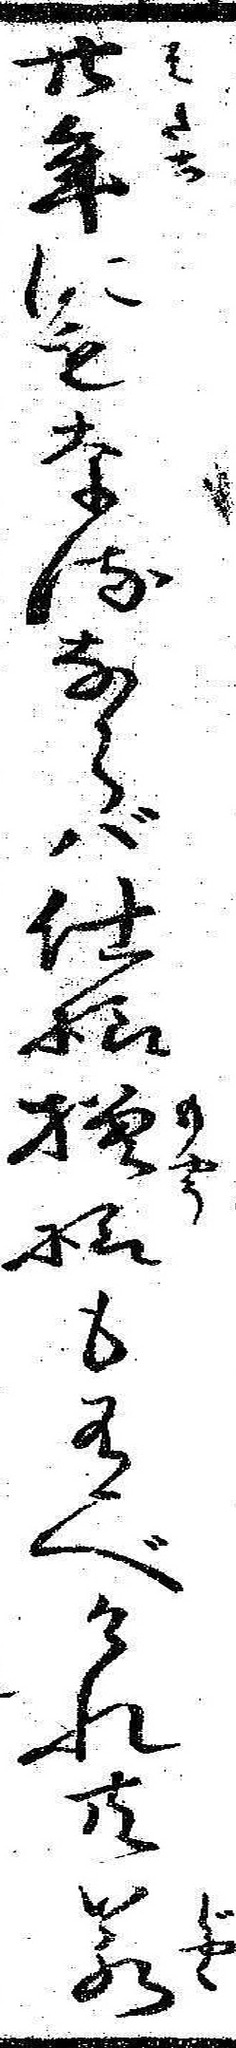廿年にもなるならば仕様模様も有べけれ共若
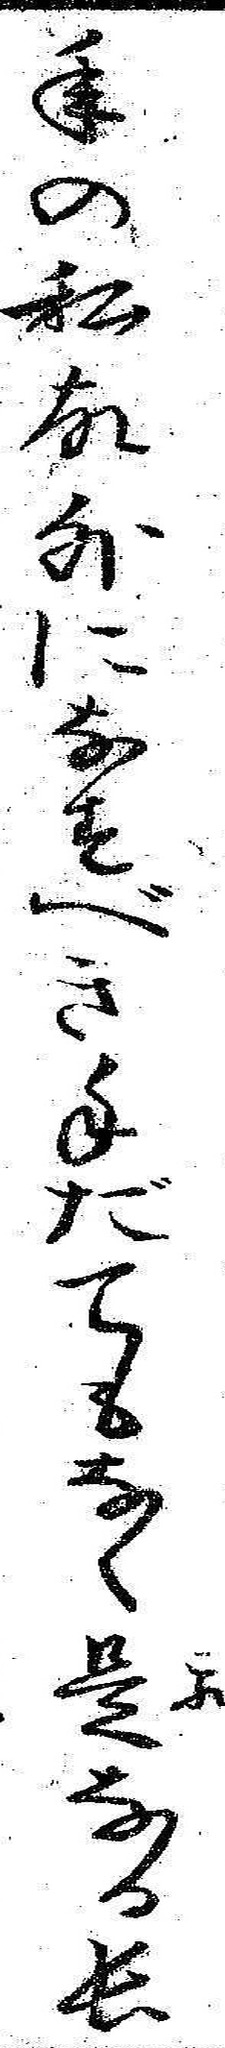年の私故外になすべき手だてもなく是なる長
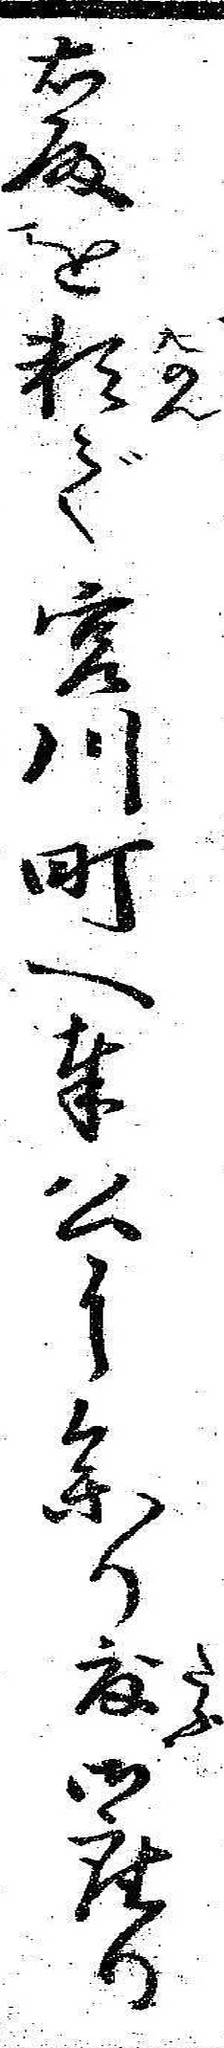右殿を頼で宮川町へ奉公に参り度御座り
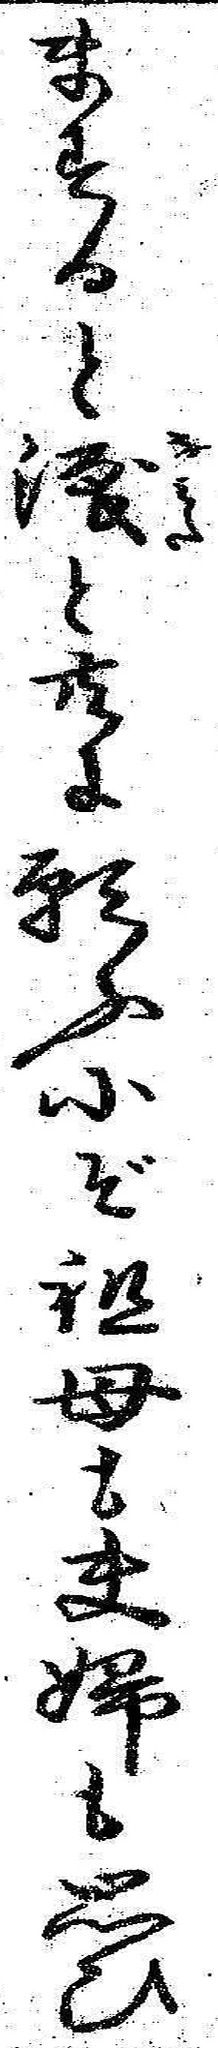ますると涙と共に願ふにぞ祖母も夫婦も思ひ

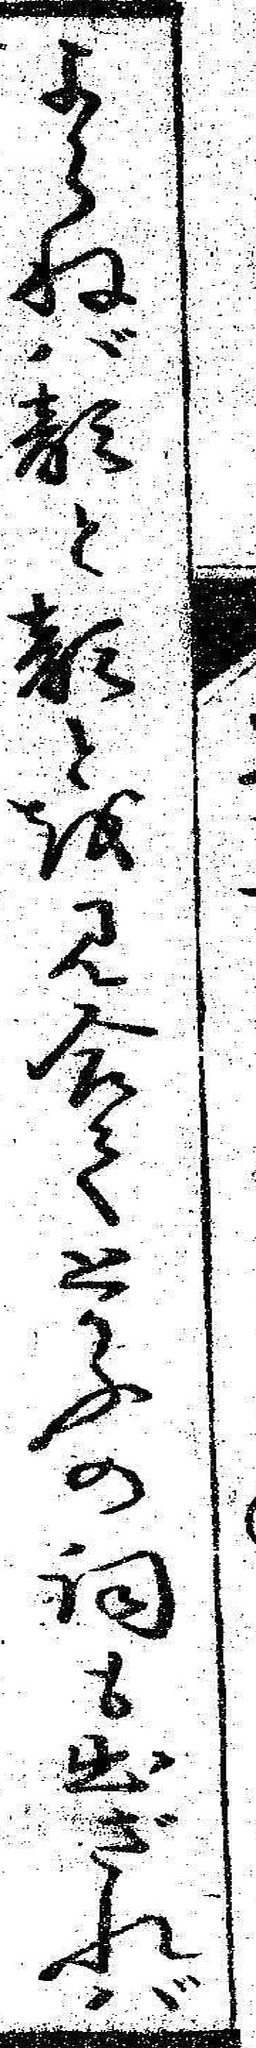よらねば顔と顔とを見合てとかふの詞も出ざれば
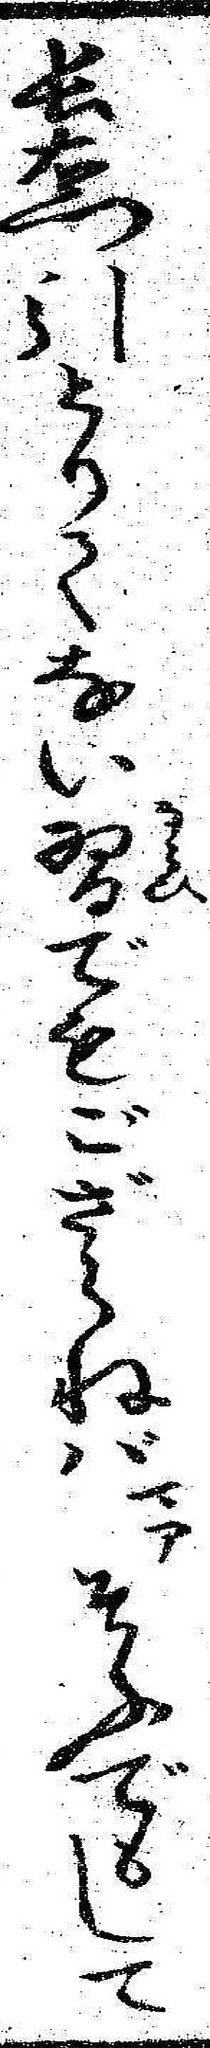長右衛門引とりてない習でもござらねば
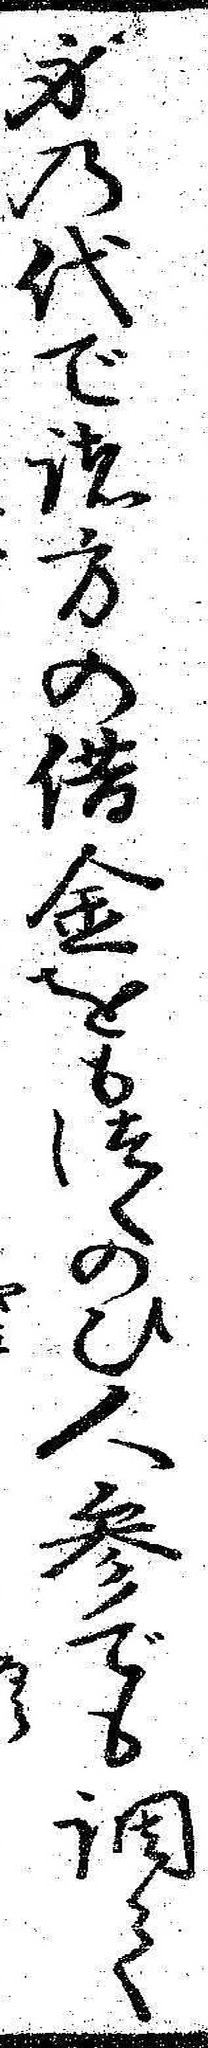身の代で諸方の借金をもつくのひ人参でも調て
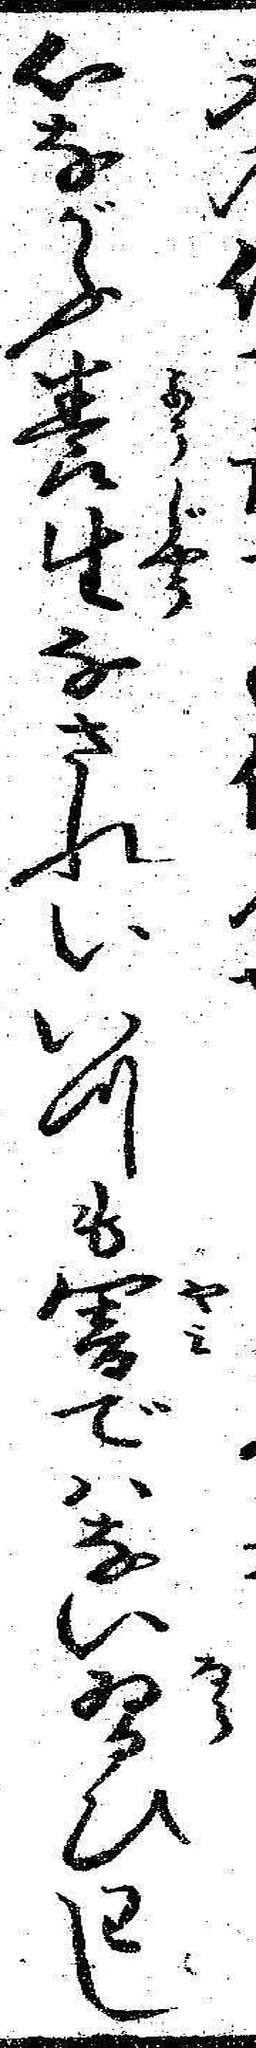心ながふ養生なされいいつも闇ではない習ひわし
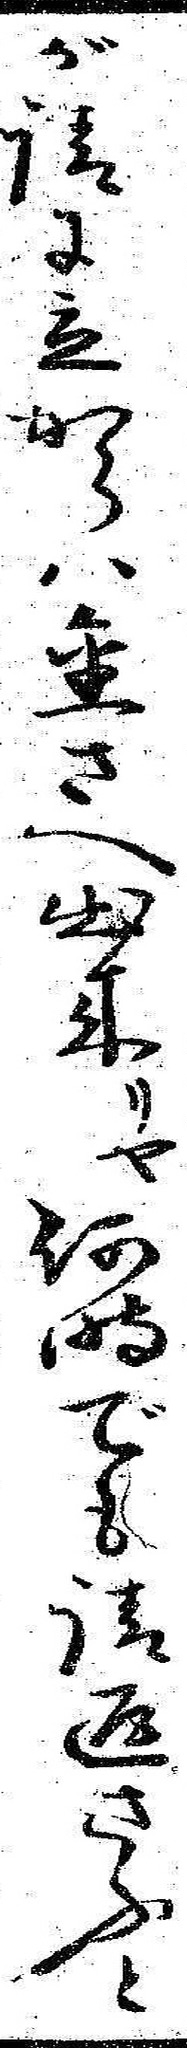が請に立からは金さへ出来何時でも請返さふと
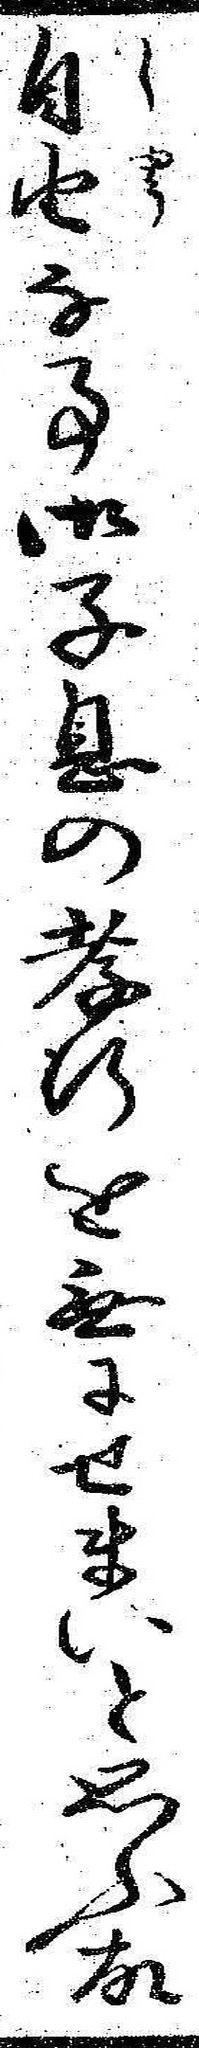自由な事御子息の孝行を無にせまいと思ふ故
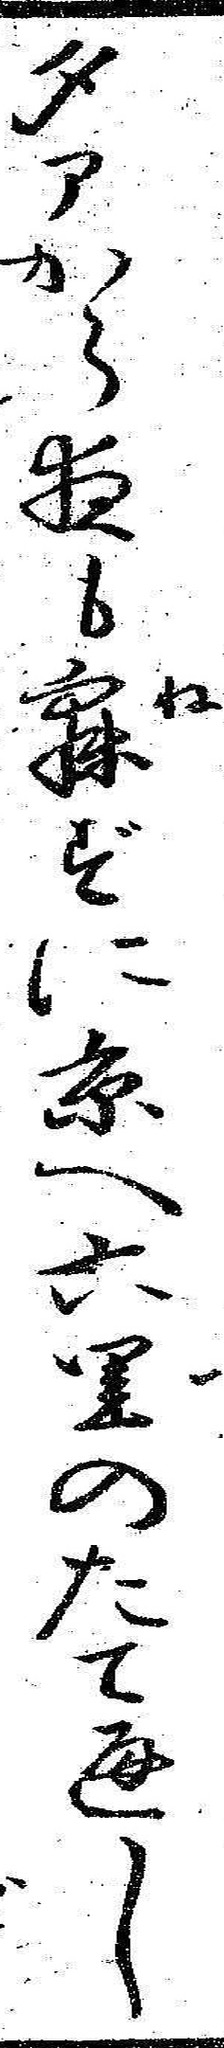夕夜も寝ずに京へ六里のたて通し
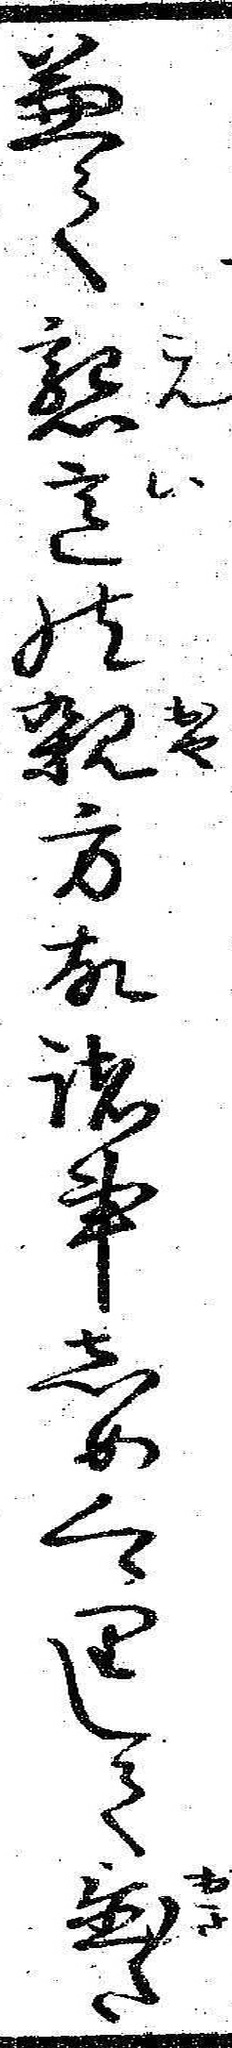兼て懇意の親方故諸事しめくゝりして置た
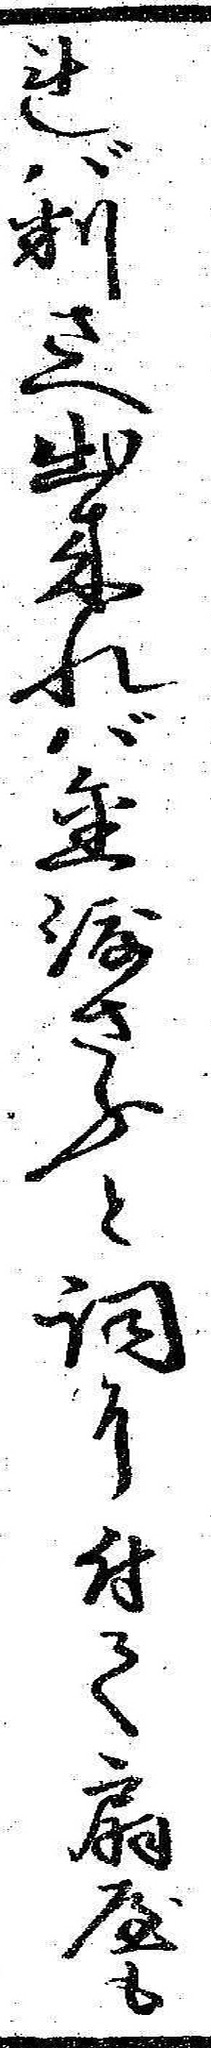れば判さへ出来れば金渡さふと詞に付て扇屋も
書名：根無草後編
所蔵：国文学研究資料館
